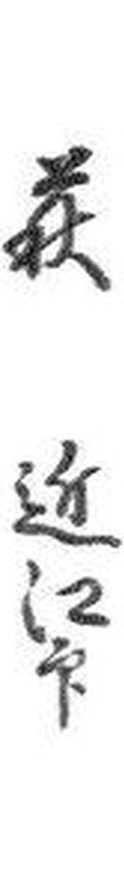萩近江印
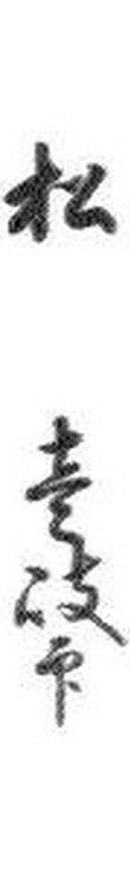松壱岐印

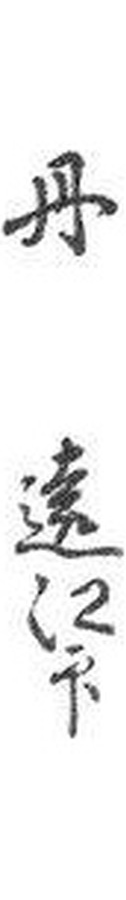丹遠江印
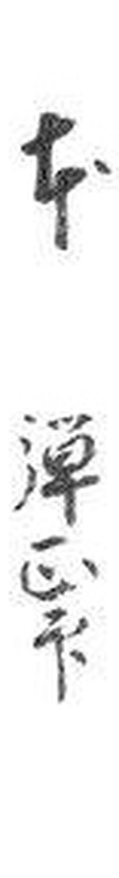本弾正印
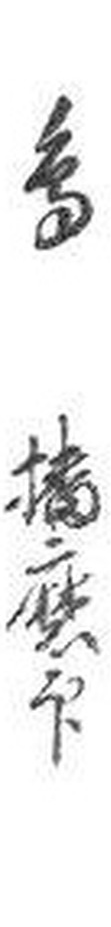鳥播磨印
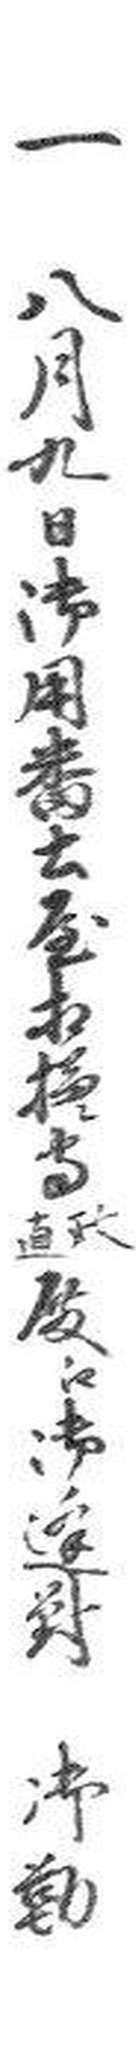一八月九日御用番土屋相模守政直殿江御逢対御勤
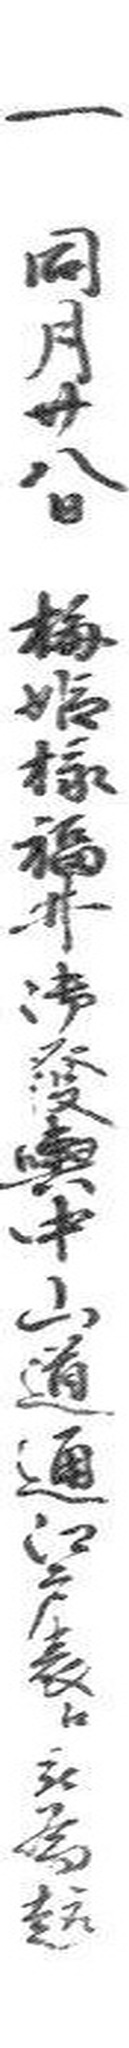一同月廿八日梅姫様福井御発輿中山道通江戸表江被為趣
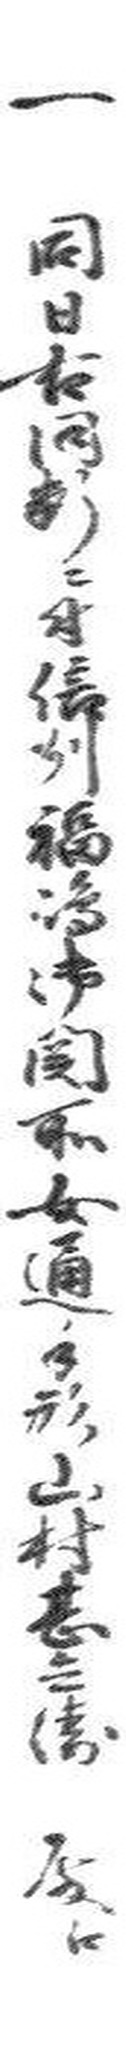一同日右同断ニ付信州福嶋御関所女通手形山村甚兵衛殿江
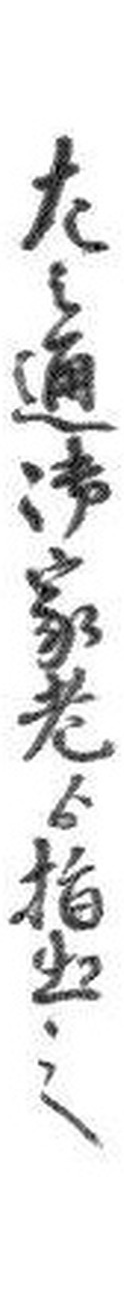左之通御家老ゟ指出之
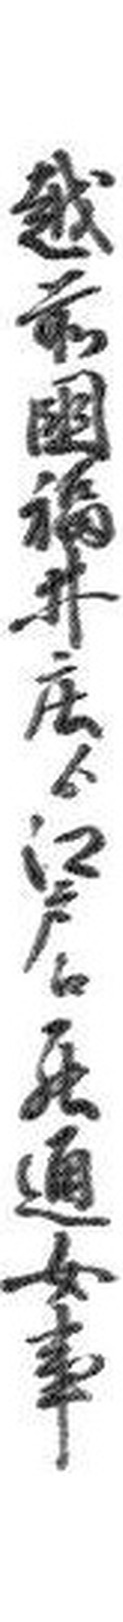越前国福井庄ゟ江戸江罷通女事
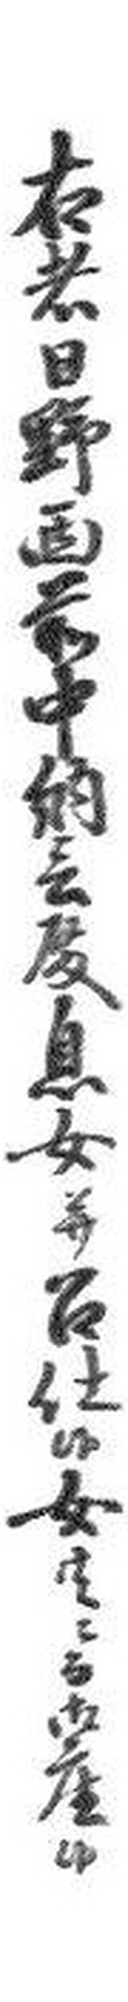右者日野西前中納言殿息女并召仕候女共ニ而御座候
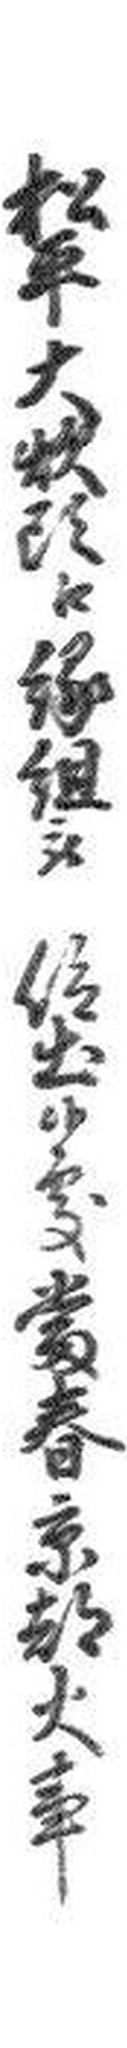松平大炊頭江縁組被仰出候処当春京都火事
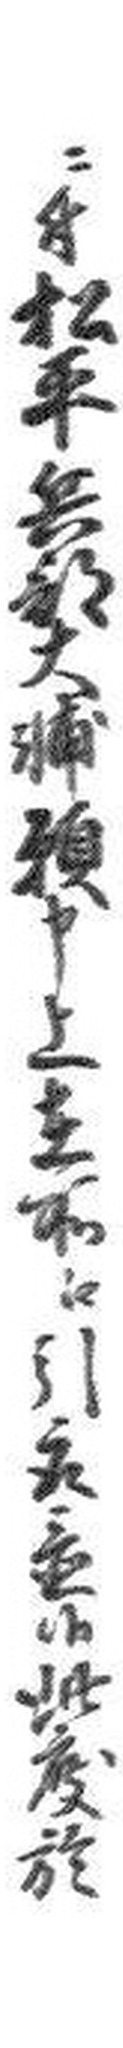ニ付松平兵部大輔願申上在所江引取置候此度於
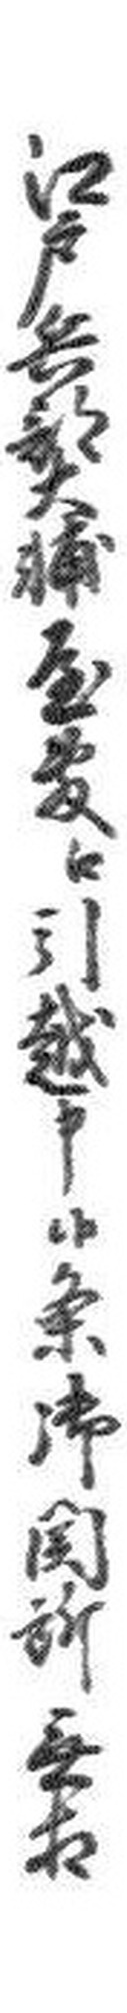江戸兵部大輔屋敷江引越申候条御関所無相

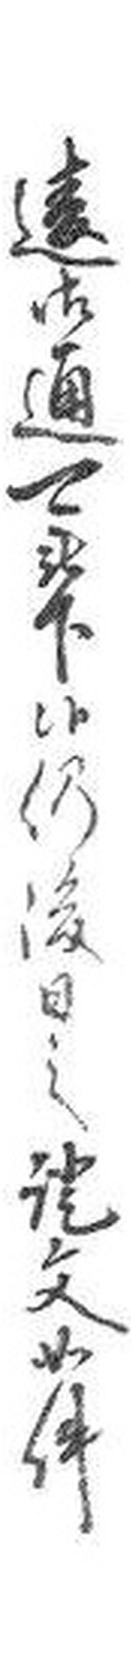違御通可被下候仍後日之証文如件
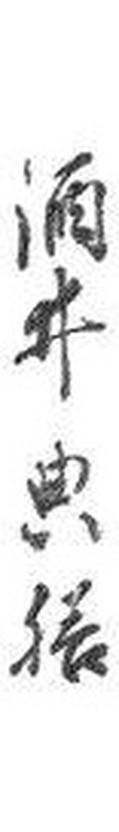酒井典膳
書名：家譜 二十四 吉品公 従宝永三年到同五年
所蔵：福井県文書館 Fukui Prefectural Archives
